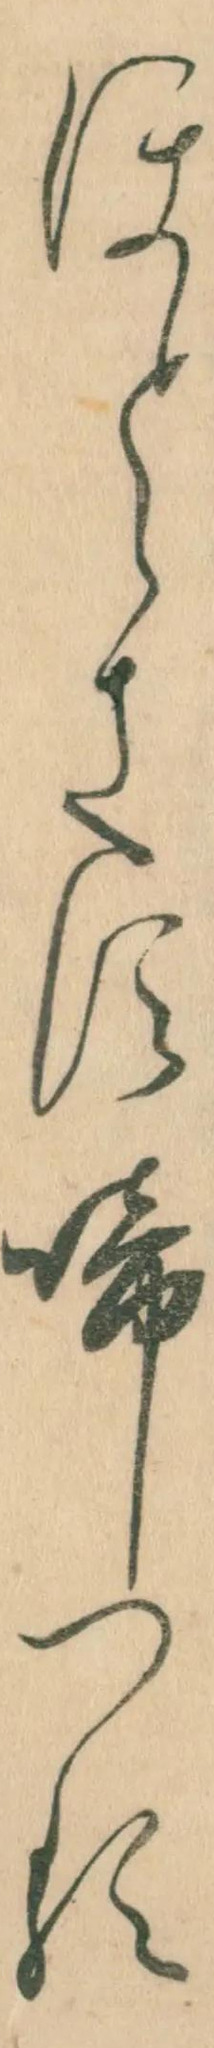ほとゝきす啼つる
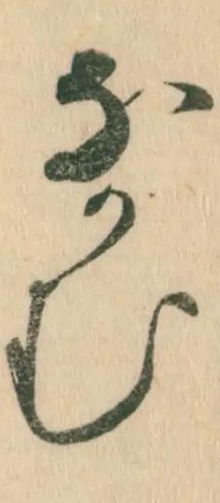なかむ

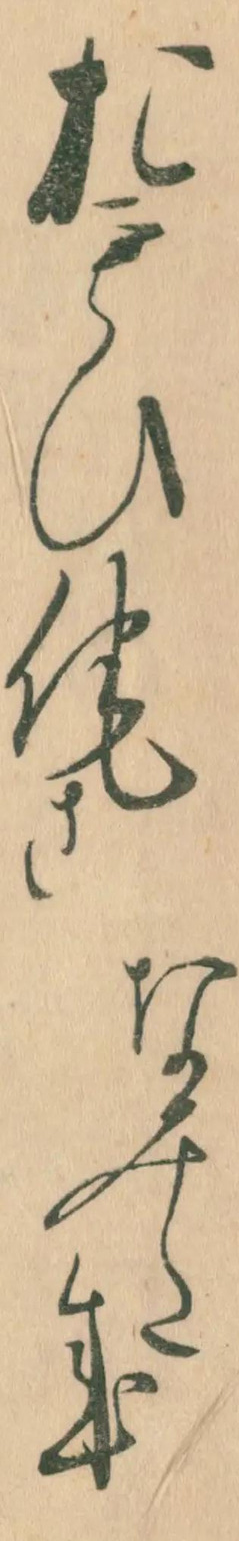おもひ侘さなみた成
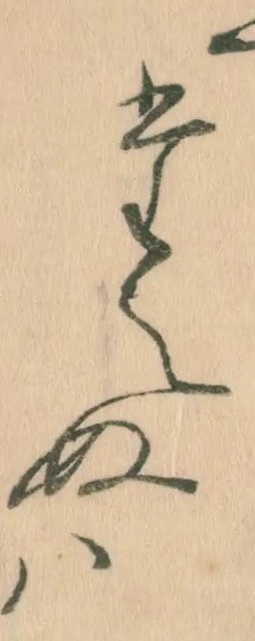たえぬは
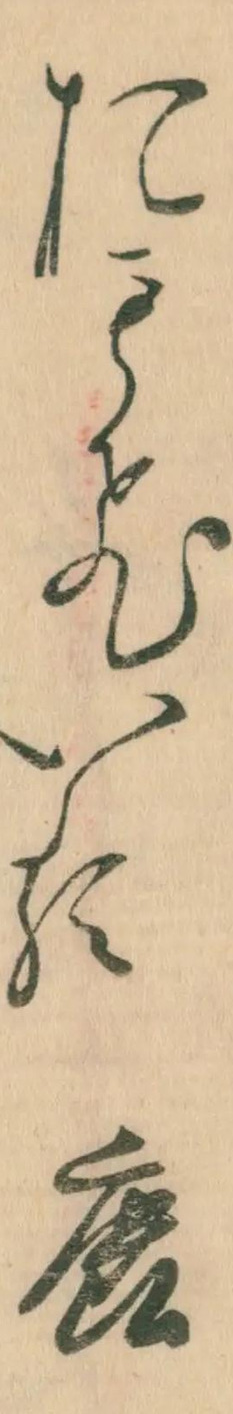おもひいる鹿
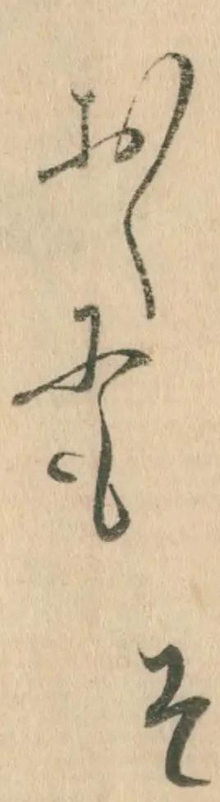おくにもそ
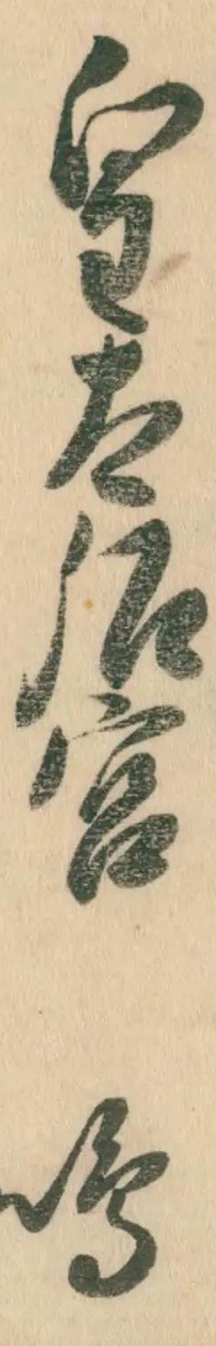皇太后宮鳴
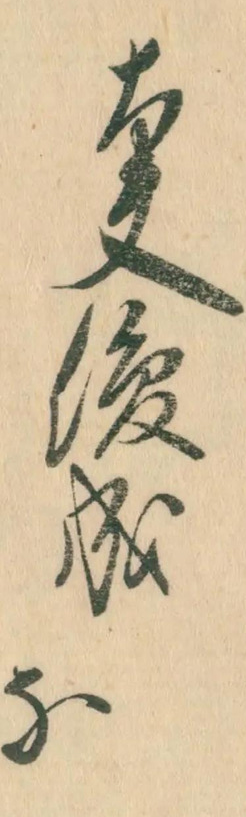大夫俊成
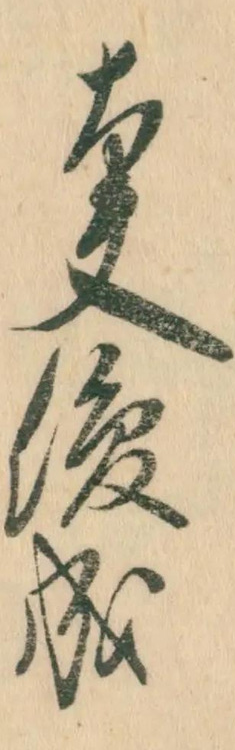大夫俊成
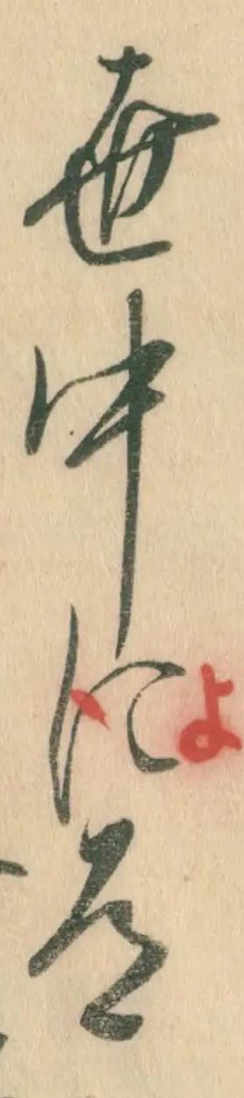世中に道
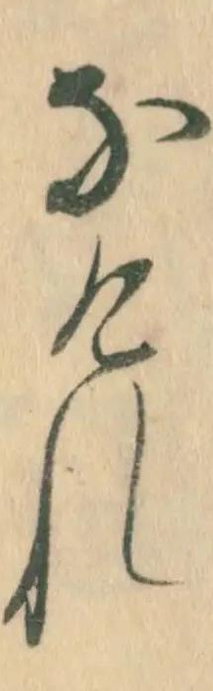なけれ

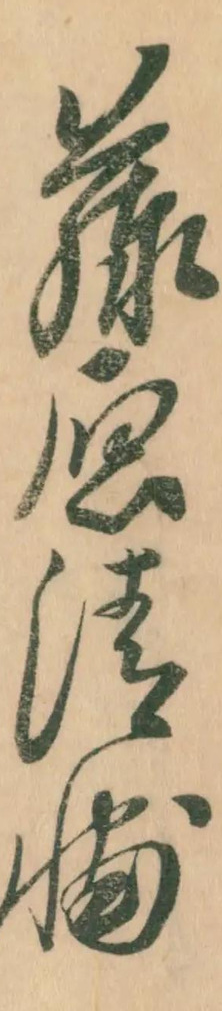藤原清輔
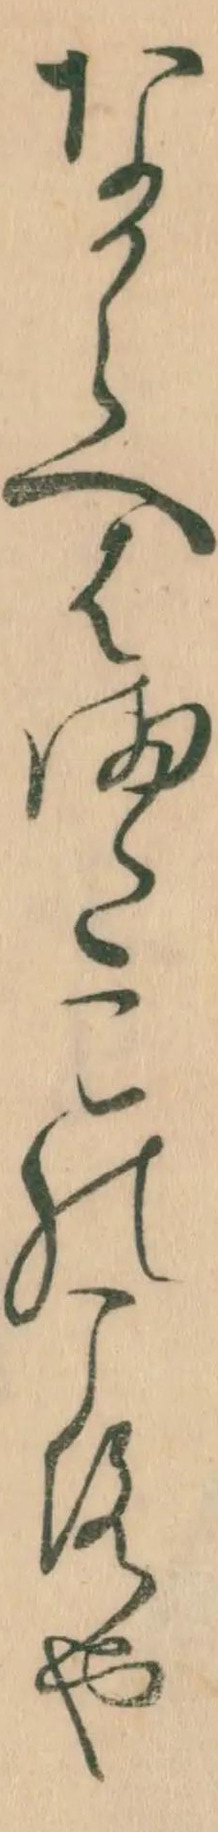なからへはまたこのころや
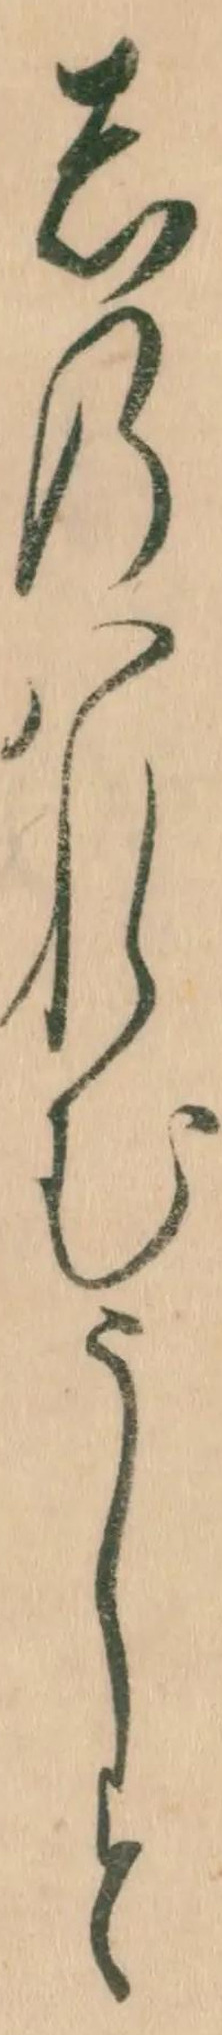しのはれむうしと
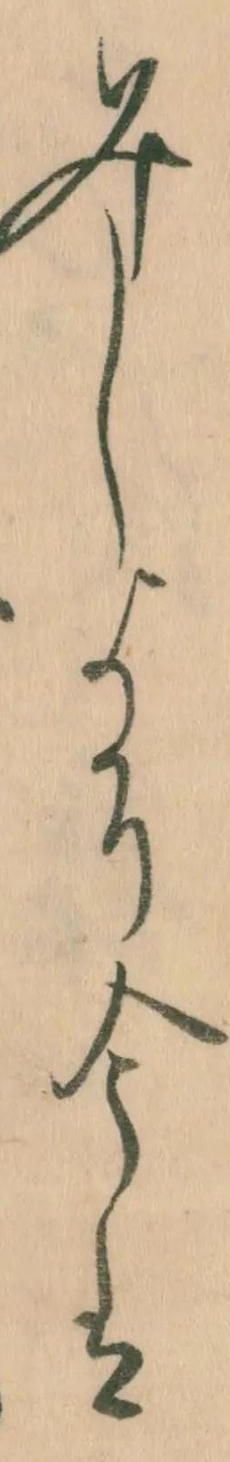みしよそ今は
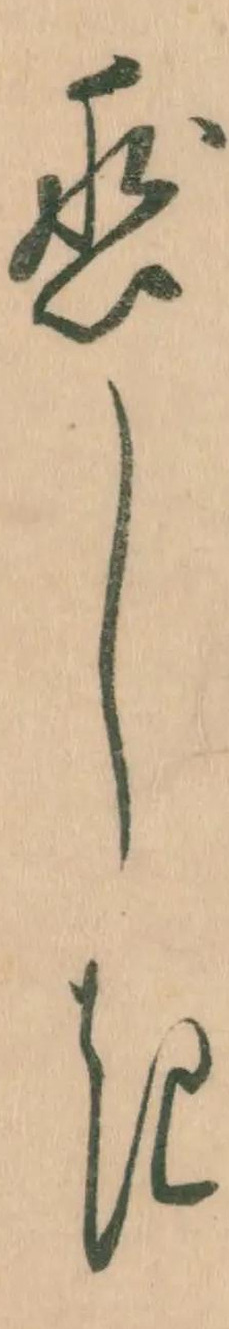恋しき
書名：錦百人一首あつま織
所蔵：国立国会図書館 National Diet Library, JAPAN
